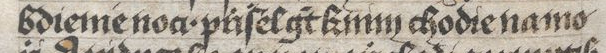bdienie noci.pṙiẛel ḡt knim chodie namo¬
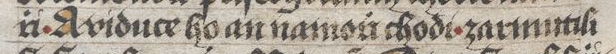ṙi.A viduce ho an namoṙi chodi.zarmutili
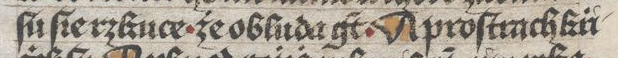ſu ſie rzkuce.że obluda ḡt.A proſtrach kṙi¬
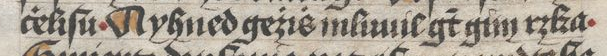ċeli ſu.A yhned geżiṡ mluuil ḡt gim rzka.
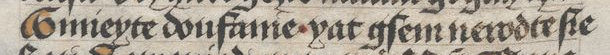Gmieyte doufaníe.yat gſem nerodte ſie
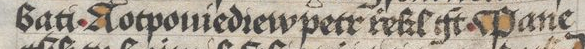bati.A otpouiediew petr ṙekl ḡt.Pane
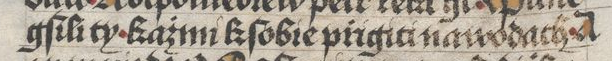gſili ty.każmi kſobie pṙigiti nawodach.A
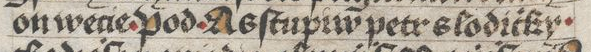on wecie.Pod.A sſtupiw petr slodiċky.
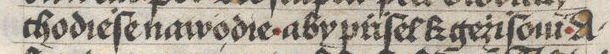chodieẛe nawodie.aby pṙiẛel k geżiẛoui.A¬
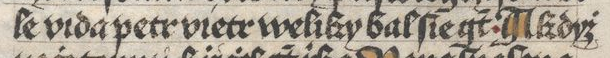le vida petr vietr weliky bal ſie ḡt.A kdyż
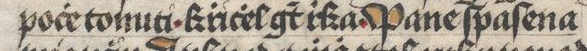poċe tonuti.kṙiċel ḡt ṙka.Pane ſpaſena
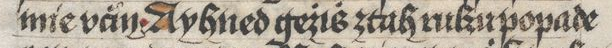míe vċin.Ay hned geżiṡ ztah ruku popade¬
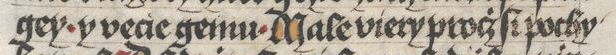gey.y vecie gemu.Male víery procż ſi pochy¬
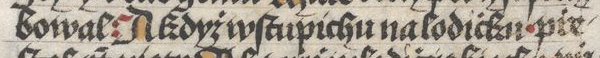bowal?A kdyż wſtupichu nalodiċku.pṙe¬
